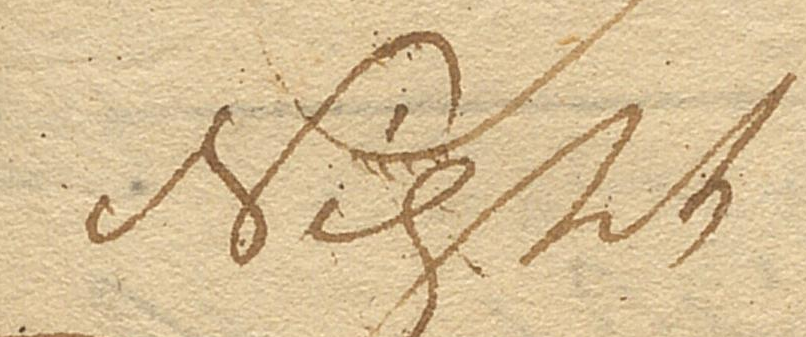Night
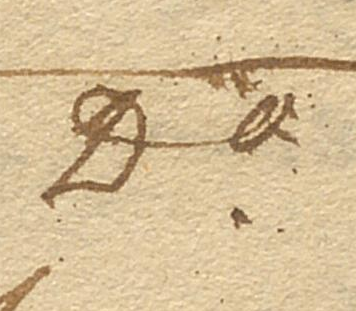D^o
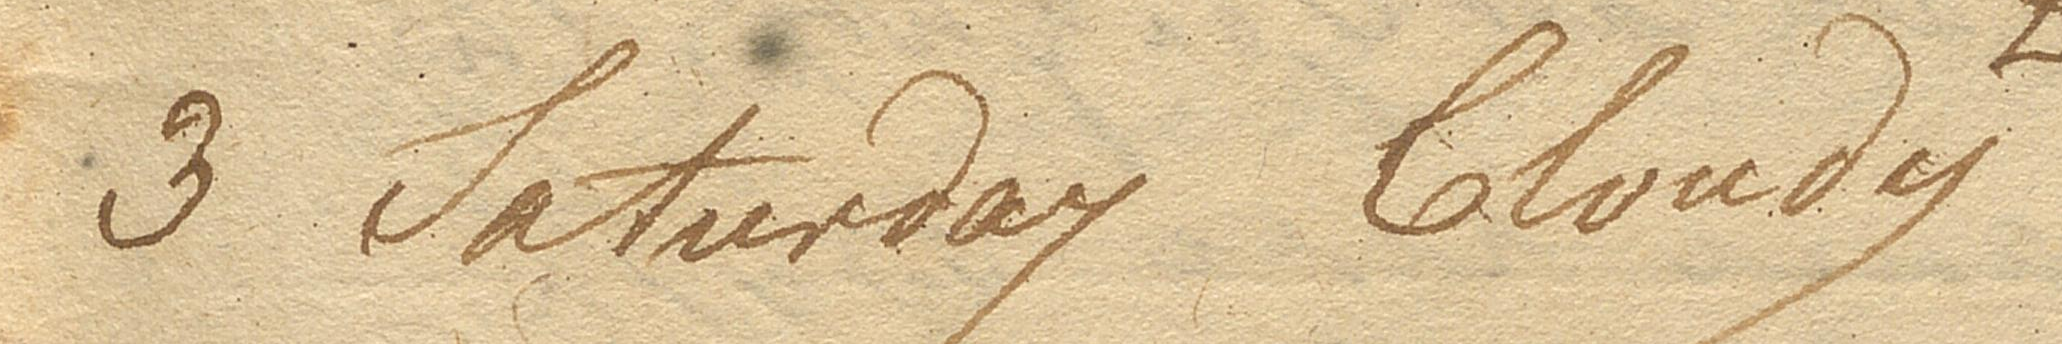3 Saturday Cloudy
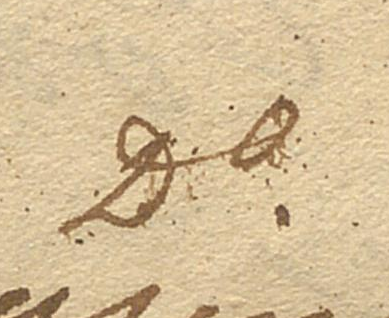D^o.
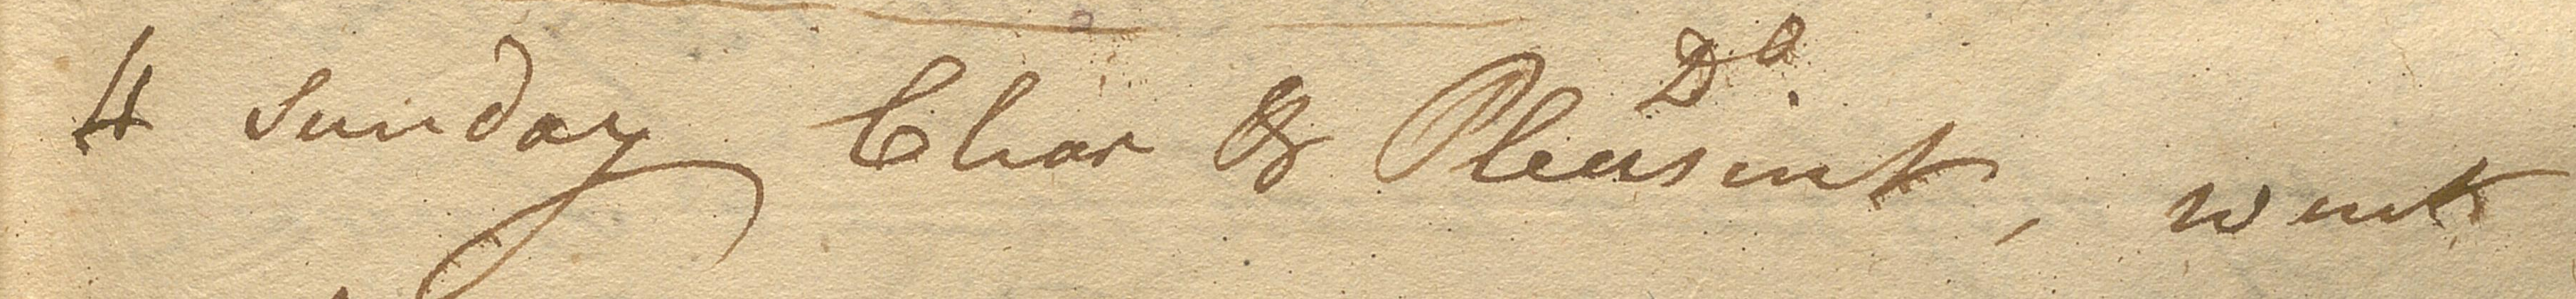4 Sunday Clear & Pleasent, went
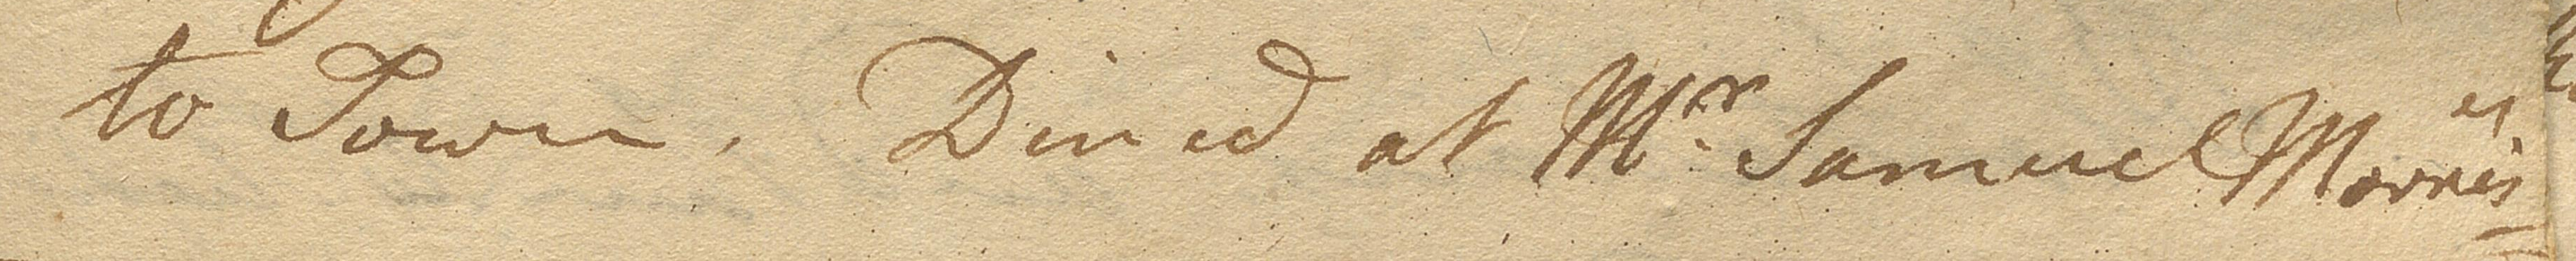to Town. Dined at M^r. Samuel Morris
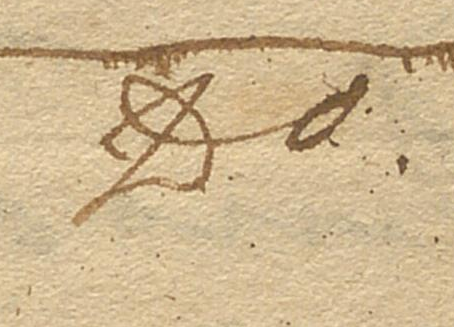D^o
